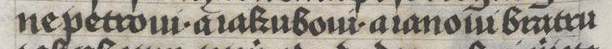ne petroui.a iakuboui.a ianoui bratra
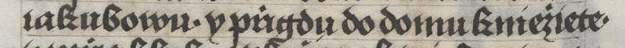iakubowu.y pṙigdu do domu knieżiete.
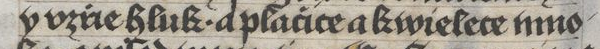y vzṙie hluk.a plaċite a kwíelece mno¬
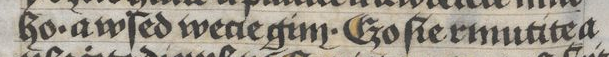ho.a wẛed wecie gim.Czo ſie rmutite a
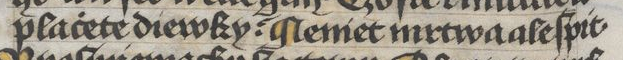plaċete dievky? Neniet mrtwá ale ſpit.
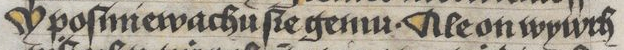Y poſmiewachu ſie gemu.Ale on wywrh
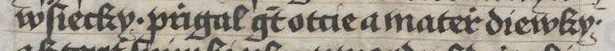wẛiecky.pṙigal ḡt otcie a mateṙ diewky.
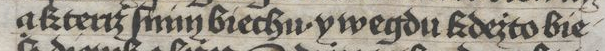a kteriž ſnim bíechu.y wegdu kdeżto bíe¬
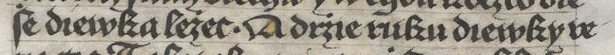ẛe diewka leżet.A drże ruku diewky ve¬
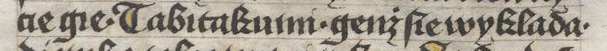cie gie.Tabitakumi.genż ſie wyklada.
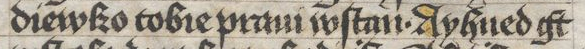diewko tobie praui wſtan. Ayhned ḡt
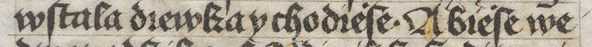wſtala dievka y chodieẛe.A bíeẛe we
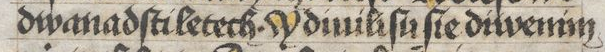dwanadſti letech.Y diuili ſu ſie diwenim
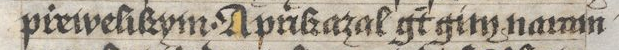pṙewelikym. A pṙikázal ḡt gím naram¬
